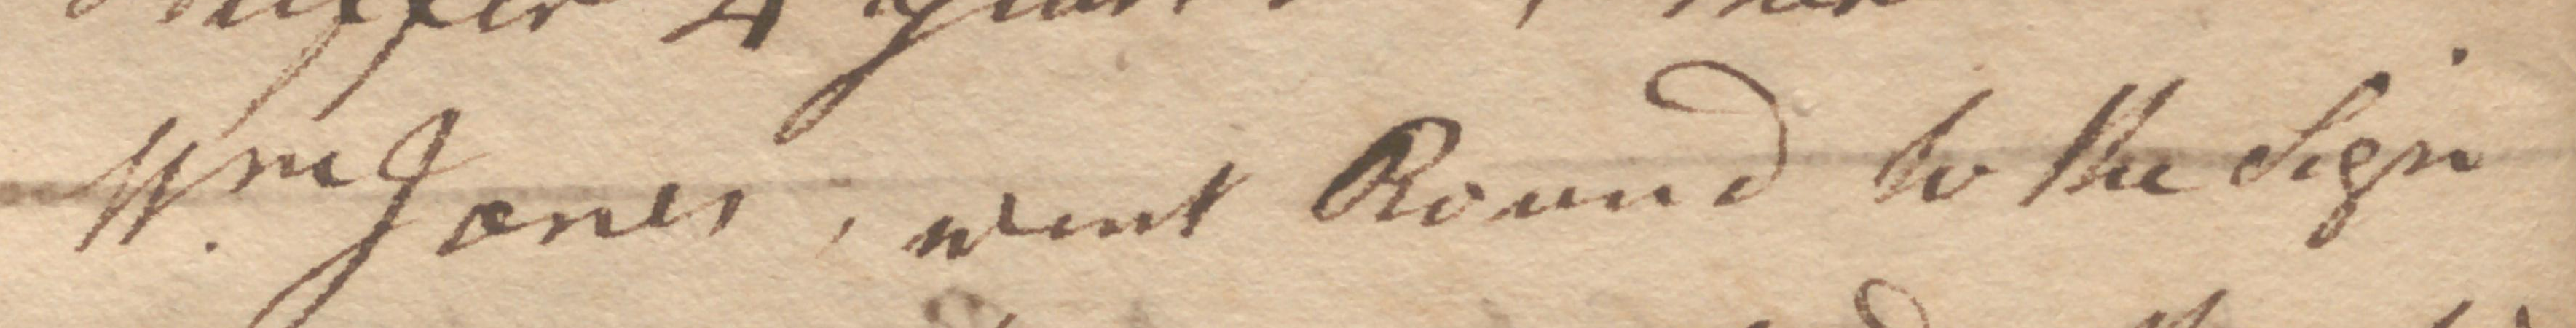W^m. Jones, went Round to the Sign
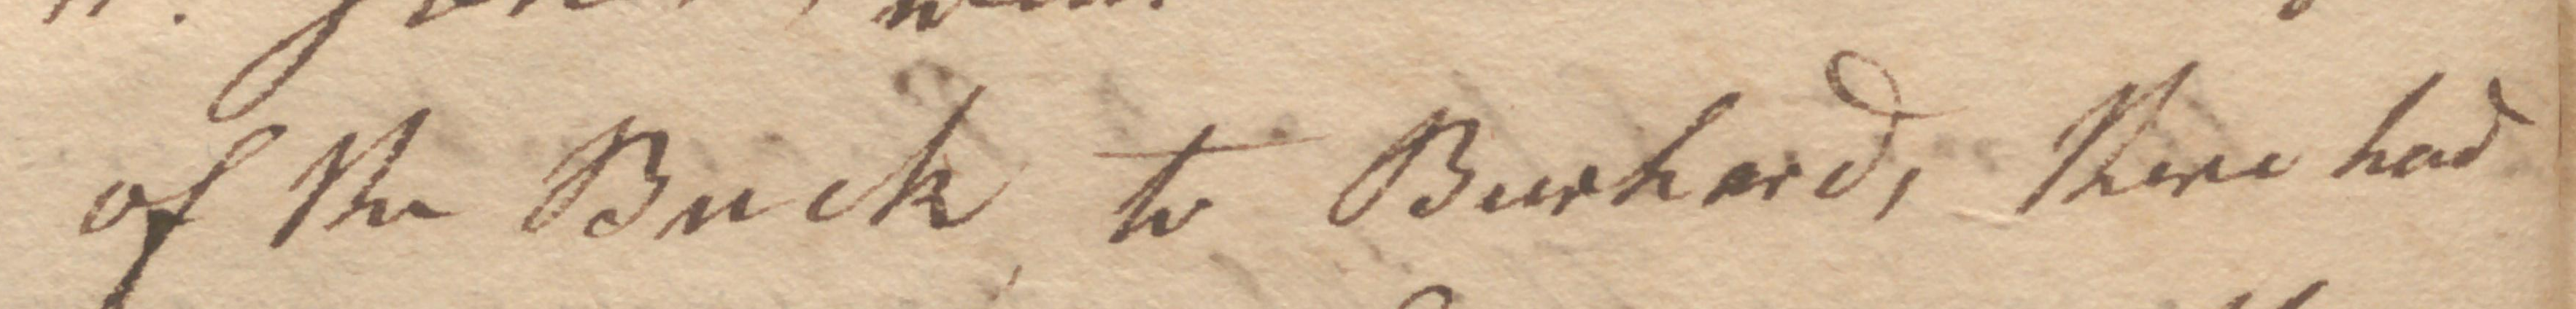of the Buck to Burhard, there had
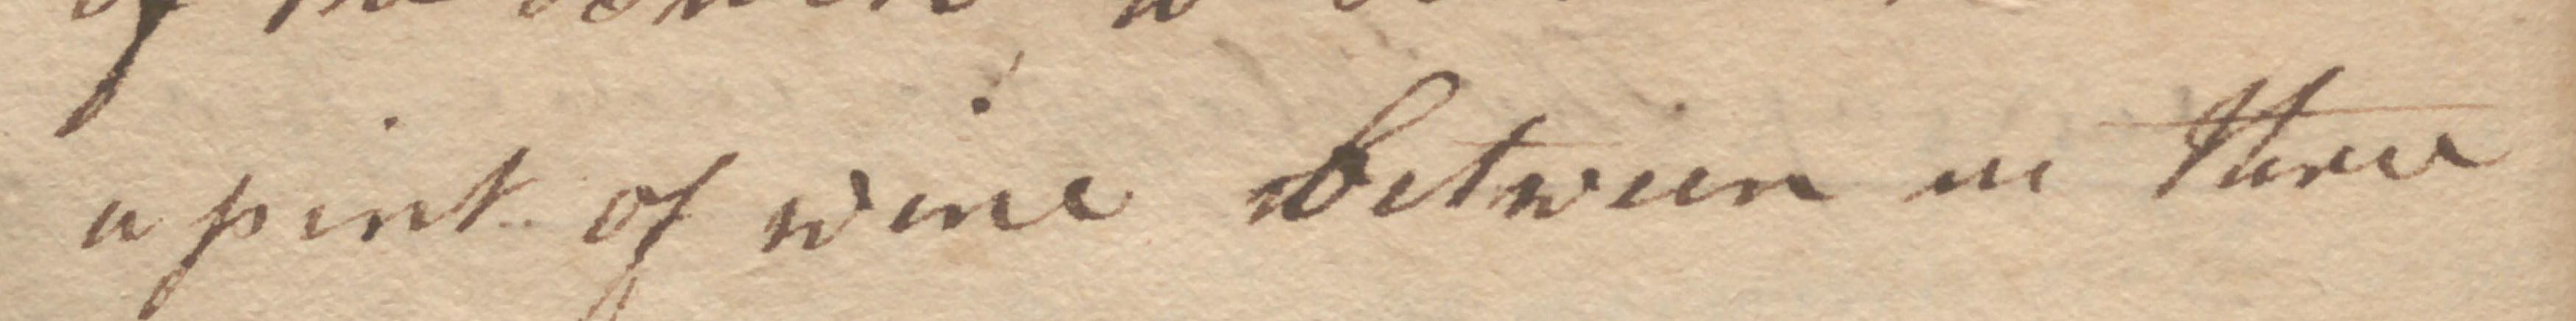a pint of wine between us three
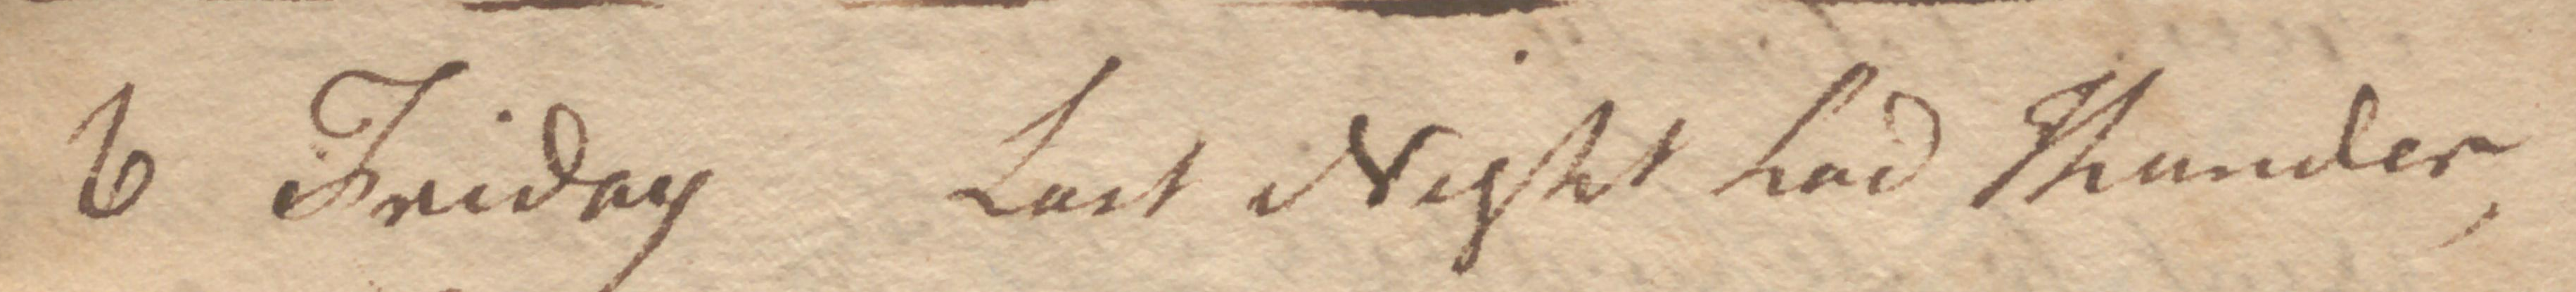6 Friday Last Night had Thunder
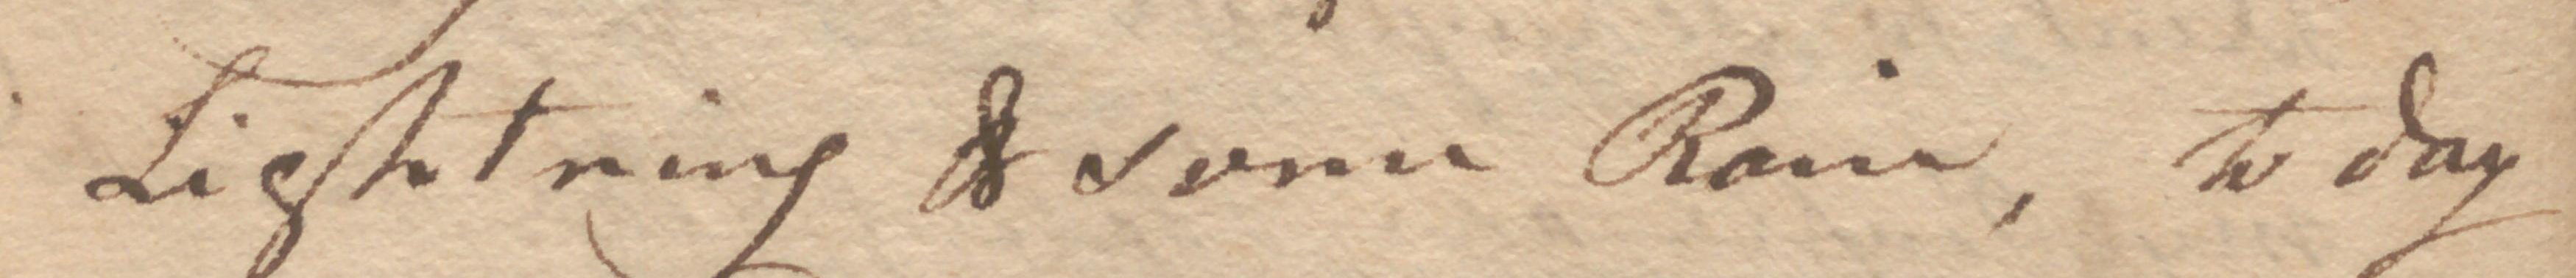Lightning & some Rain to day
